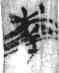南
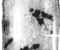北
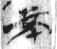不
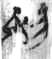利（利）
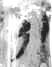人
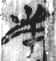民
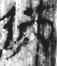凥（居）
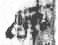西
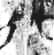北
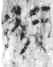凥（居）
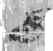西
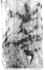南
